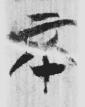不
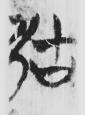居
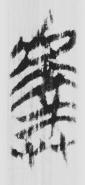{虍㚔廾}
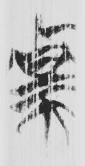{真天}（祗）
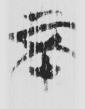不
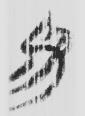易
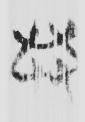共
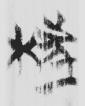{木㞷}
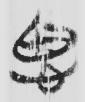思
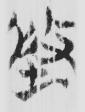{攸土}
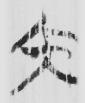內
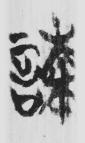諫
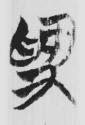受
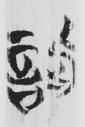訾
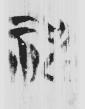神
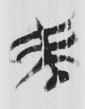民
